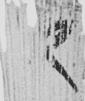女（汝）
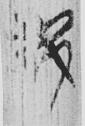弗
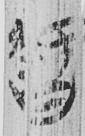智（知）
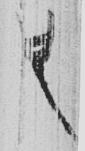也
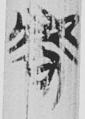○（乎）
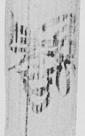䌛（由）
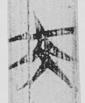夫
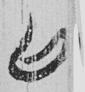㠯（以）
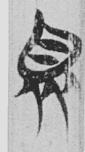眾
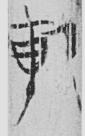○（犯）
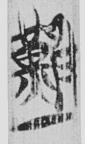○（難）
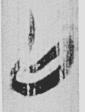㠯（以）
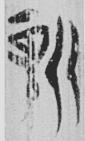新（親）
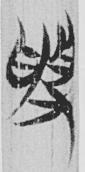受
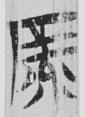備（祿）
